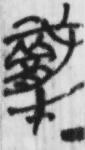牛戠
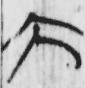大
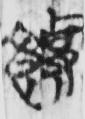饋
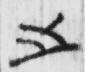之
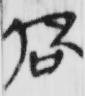卲
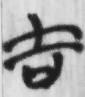吉
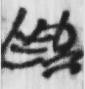爲
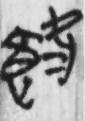既
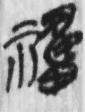禱
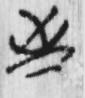至（致）
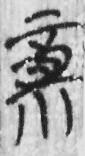福
